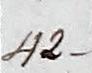42
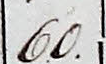60.
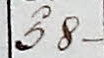58
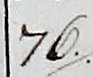76
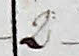2
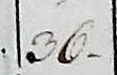36
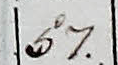57.
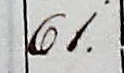61.
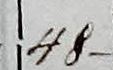48
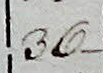36
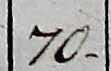70
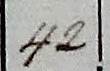42
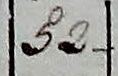52
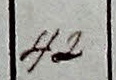42
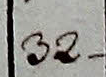32
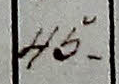45
